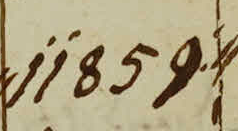11859
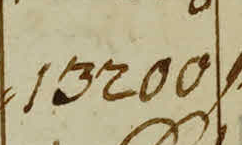13200
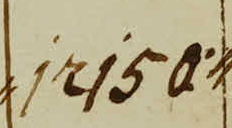12150.
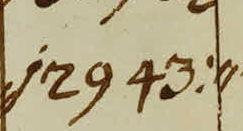12943:
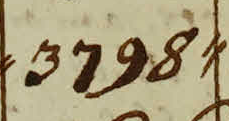3798
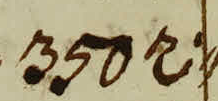3502
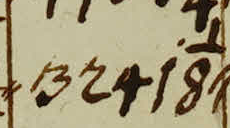132418
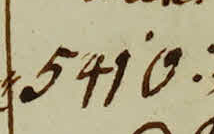5410
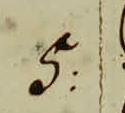5:
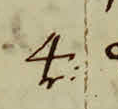4:
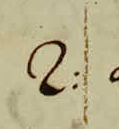2:
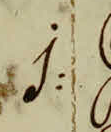1:
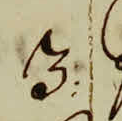3:
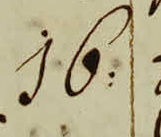16:
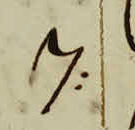7:
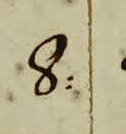8:
